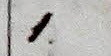1.
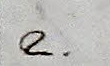2.
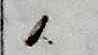1.
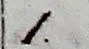1.
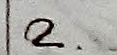2.
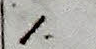1.
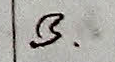3.
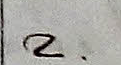2.
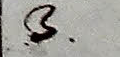3.
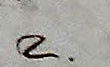2.
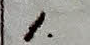1.
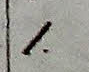1.
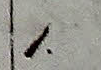1.
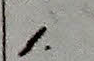1.
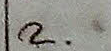2.
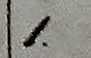1.
